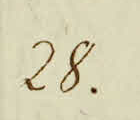28.
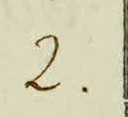2.
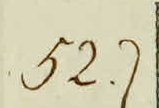52.
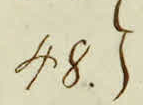48.
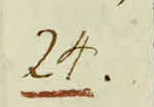24.
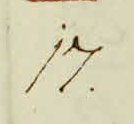17.
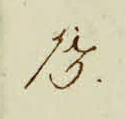13.
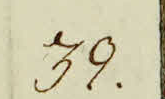39.
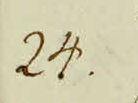24.
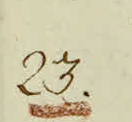23.
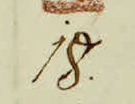18.
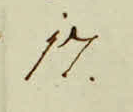17.
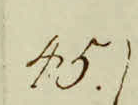45.
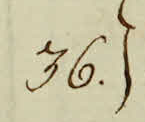36.
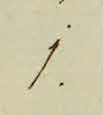1.
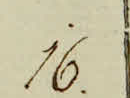16.
